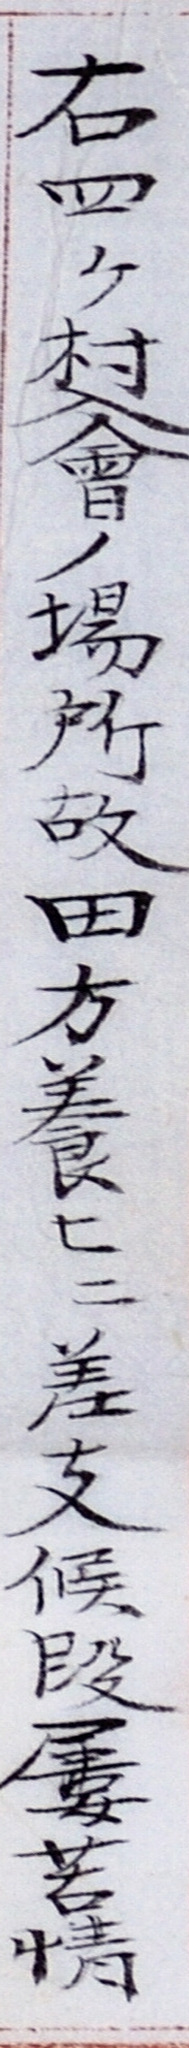右四ヶ村人会ノ場所故田方養ヒニ差支候段屢苦情
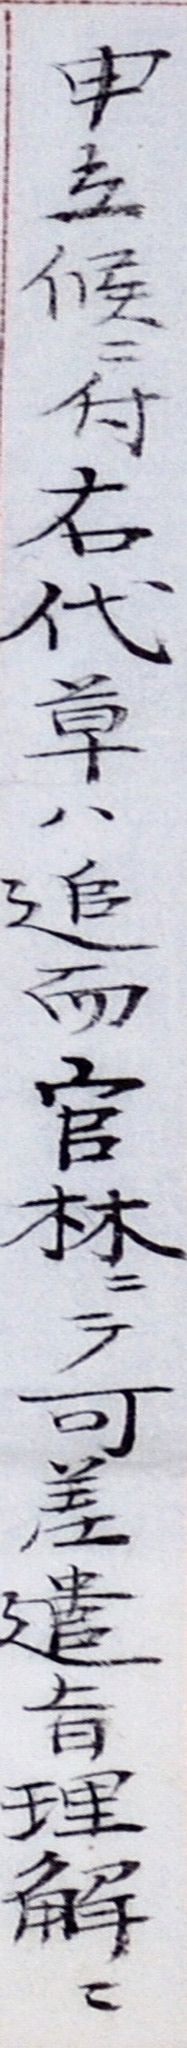申立候ニ付右代草ハ追而官林ニテ可差遣旨理解ニ
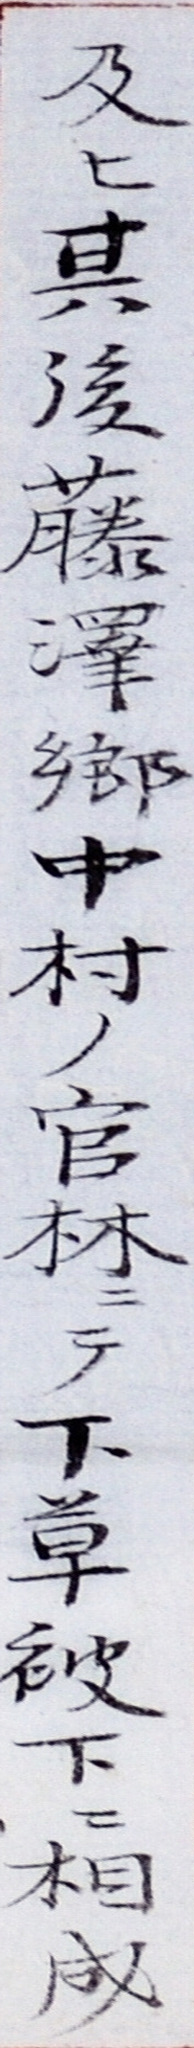及ヒ其後藤澤郷中村ノ官林ニテ下草被下ニ相成
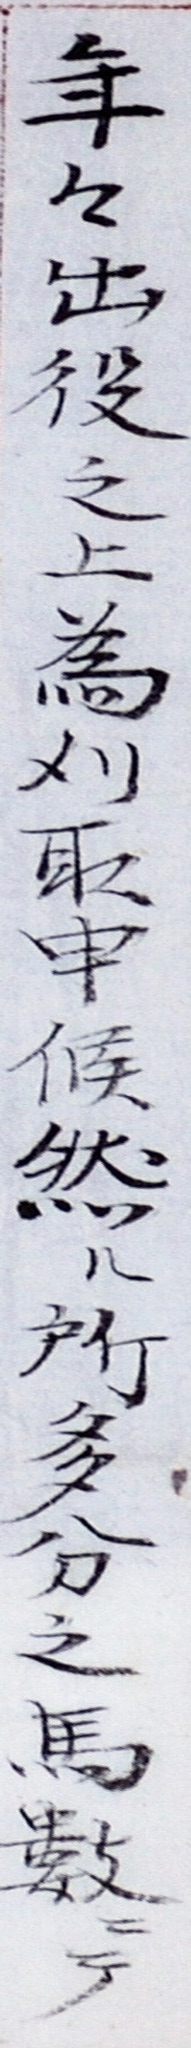年々出役之上為刈取申候然ル所多分之馬数ニテ
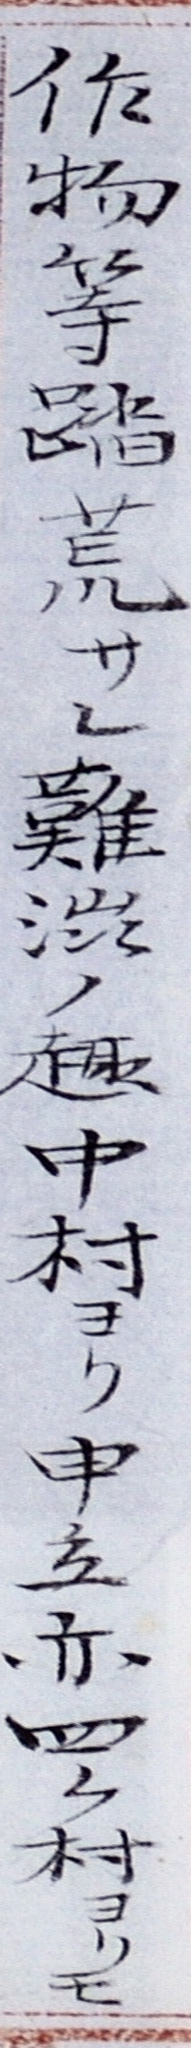作物等踏荒サレ難渋ノ趣中村ヨリ申立亦四ヶ村ヨリモ
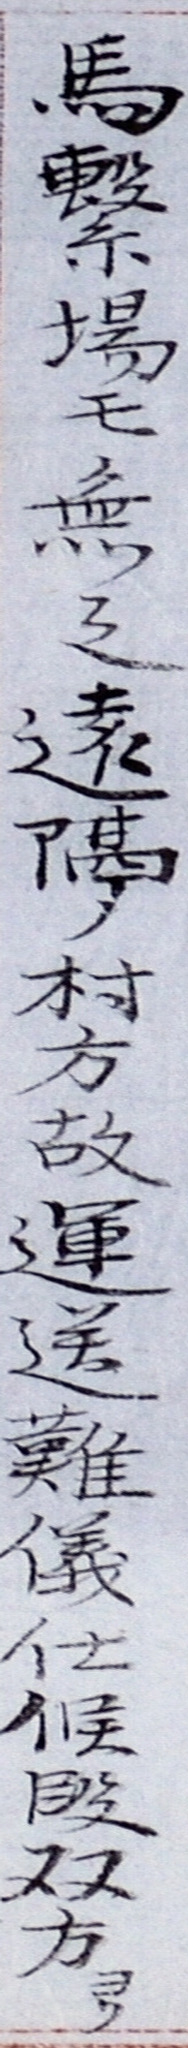馬繋場モ無之遠隔ノ村方故運送難儀仕候段双方ヨリ
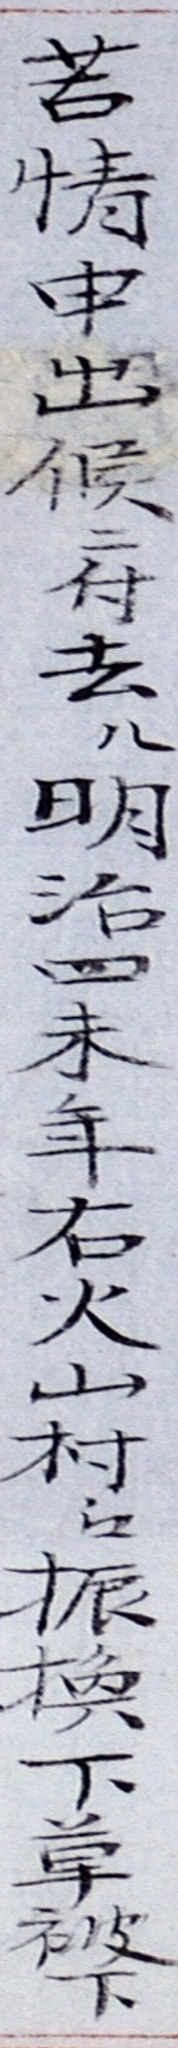苦情申出候ニ付去ル明治四未年右火山村江振換下草被下
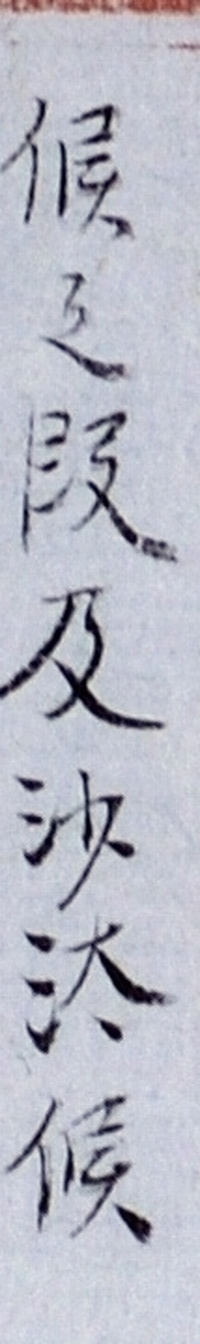候之段及沙汰候
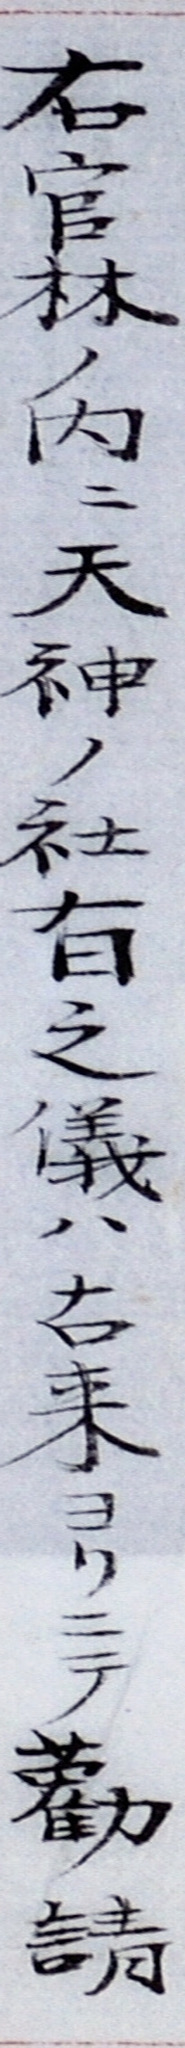右官林ノ内ニ天神ノ社有之儀ハ古来ヨリニテ勧請
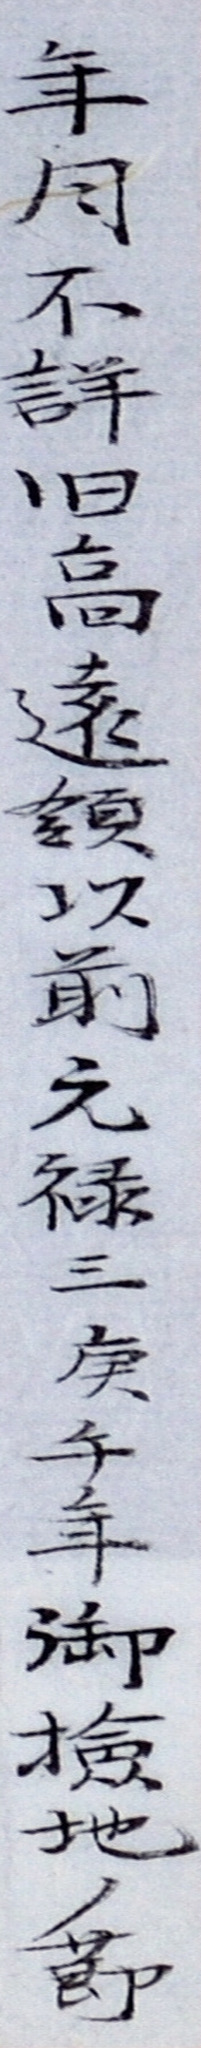年月不詳旧高遠領以前元禄三庚午年御検地ノ節
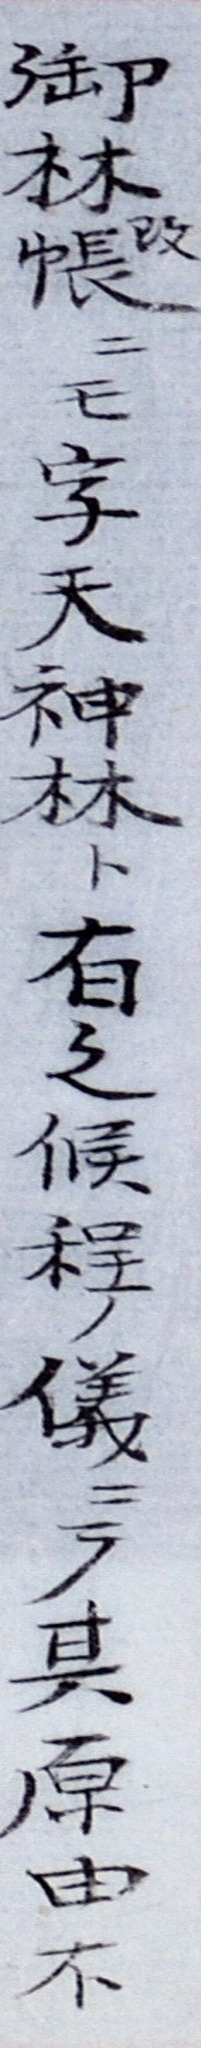御林改帳ニモ字天神林ト有之候程ノ儀ニテ其原由不
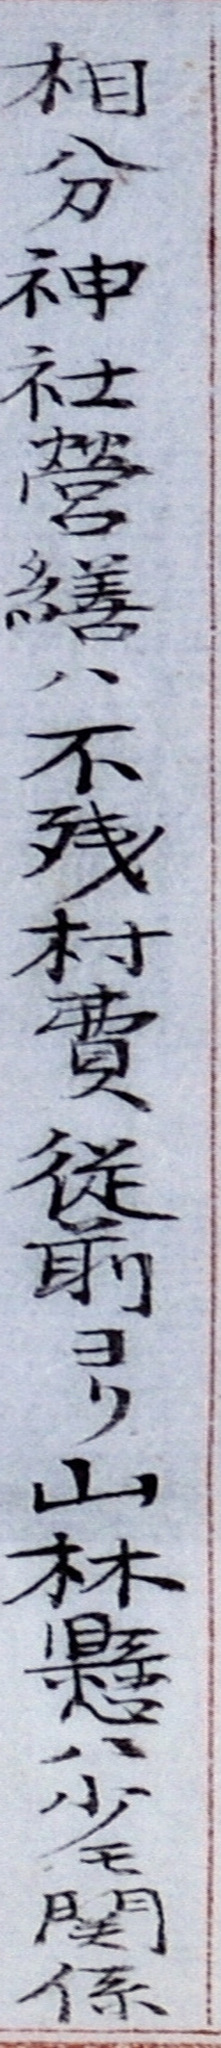相分神社営繕ハ不残村費従前ヨリ山林懸ハ少モ関係
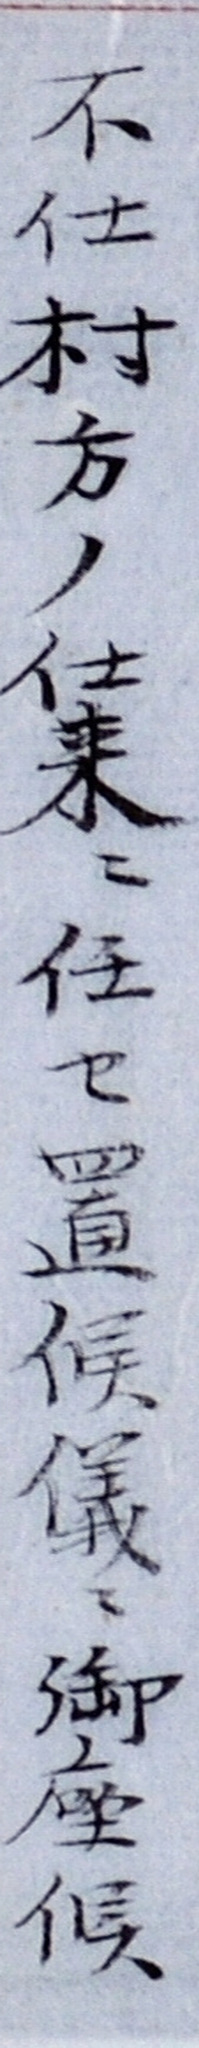不仕村方ノ仕来ニ任セ置候儀ニ御座候
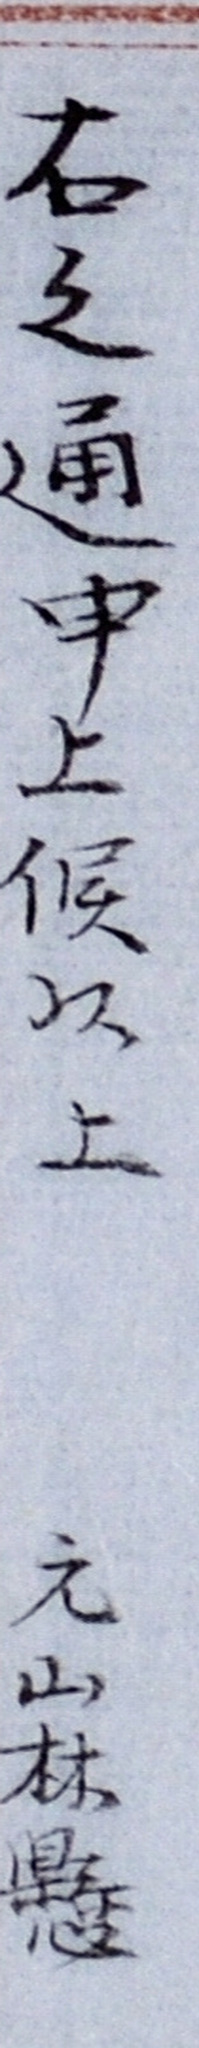右之通申上候以上元山林懸
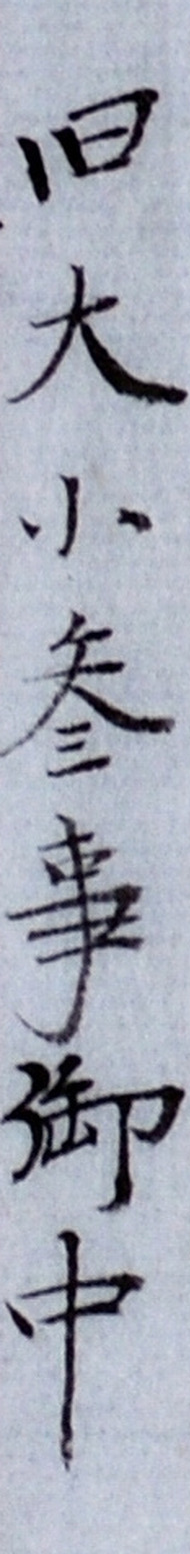旧大小参事御中

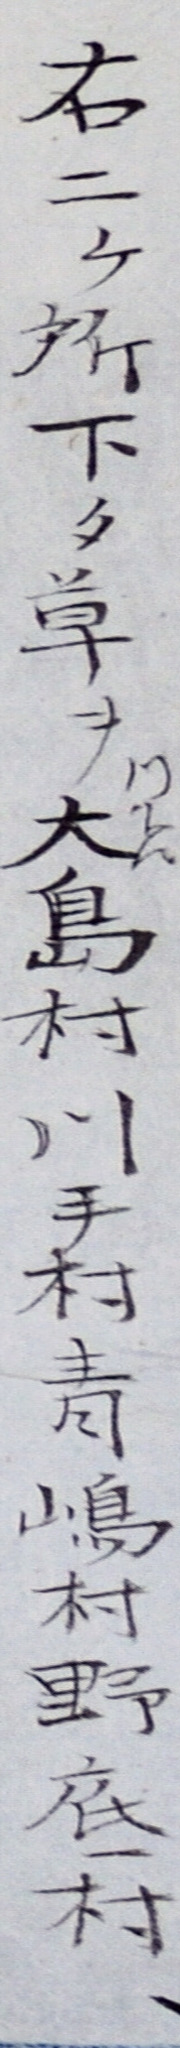右二ヶ所下タ草ヲ川下口大島村川手村青嶋村野底村へ
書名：火山村官林并北林村官林ニ付
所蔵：伊那市立高遠町図書館・合同会社AMANE
